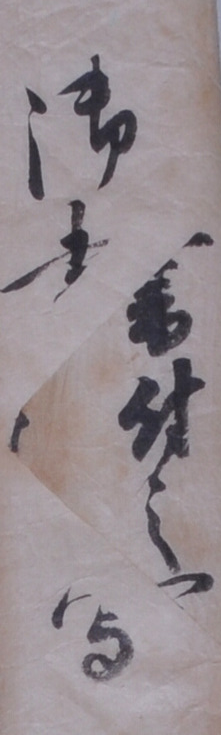御書付の写

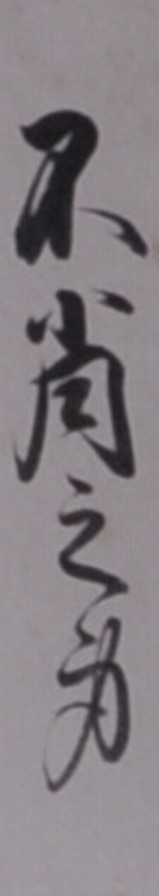不肖の身
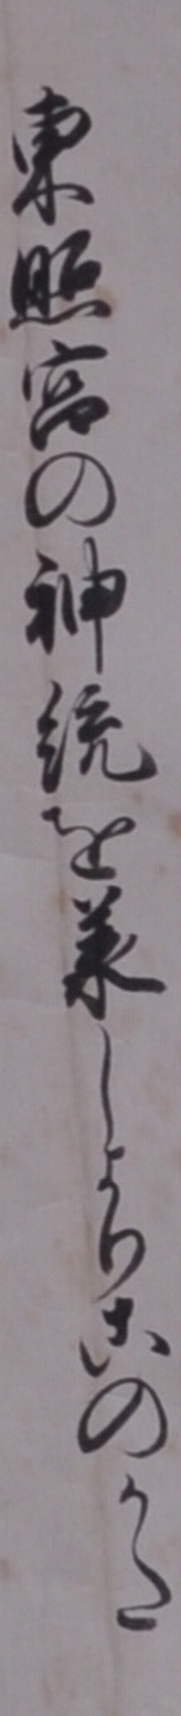東照宮の神統を承しよりこのかた
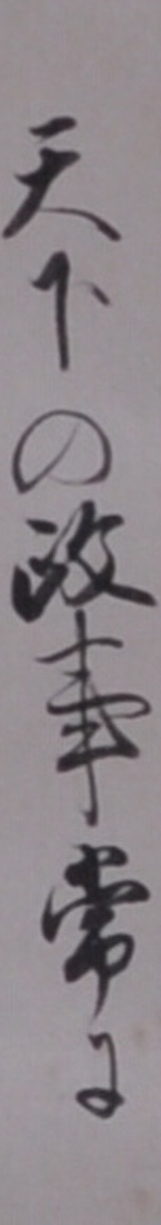天下の政事常に
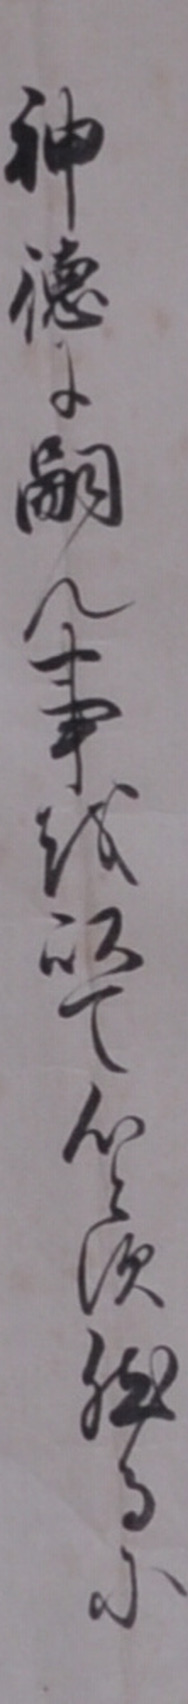神徳に嗣ん事を以て心とす然るに
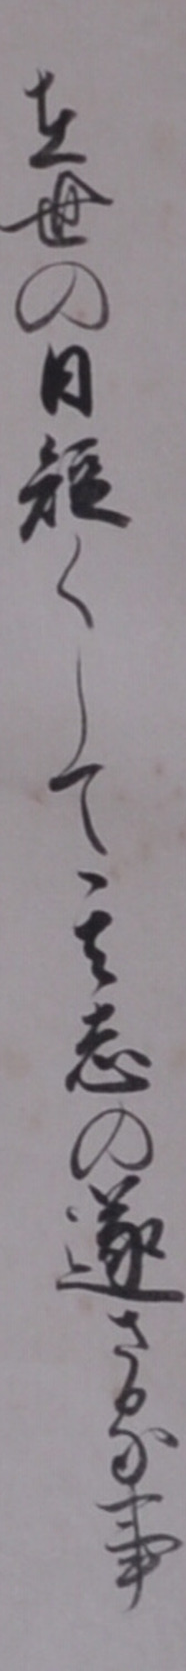在世の日短くして其志の遂さる事
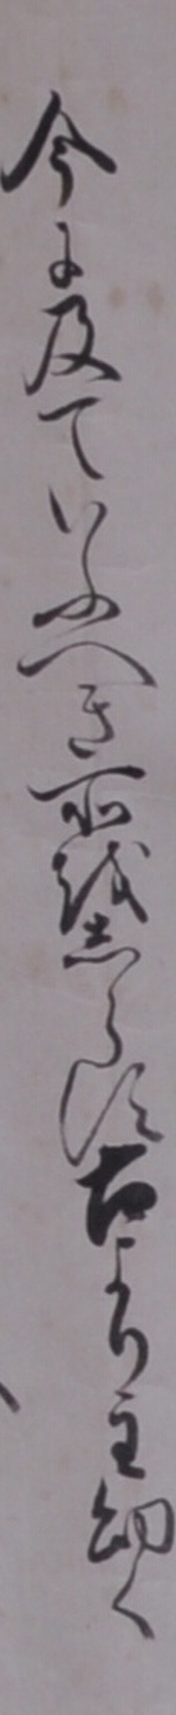今に及ていふへき所をしらす古より主幼く
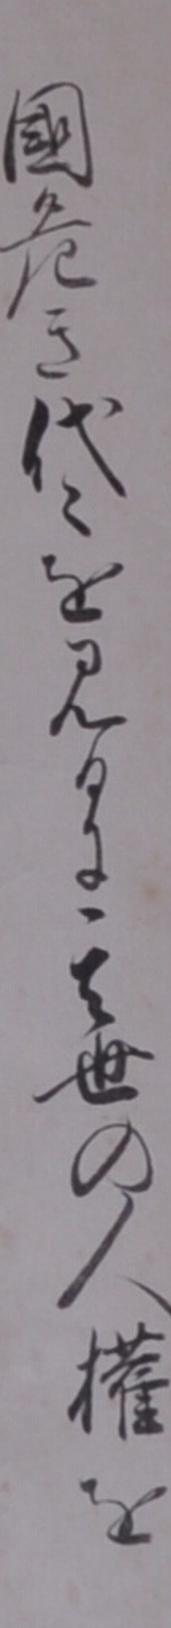国危き代々を見るに其世の人権を
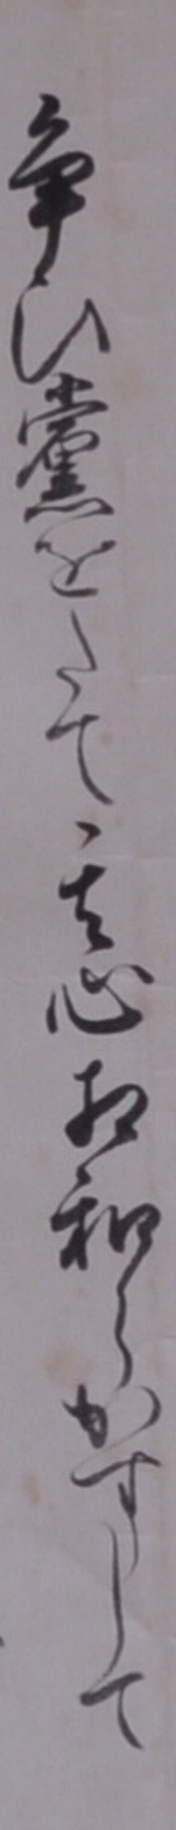争ひ党をたて其心相和らかすして
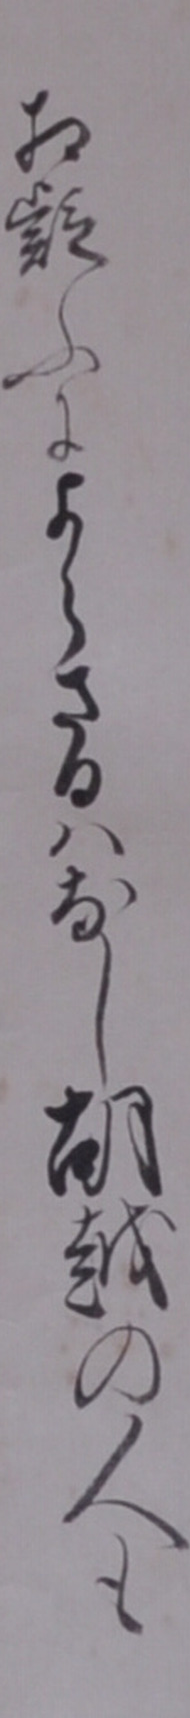相疑ふによらさるはなし胡越の人も
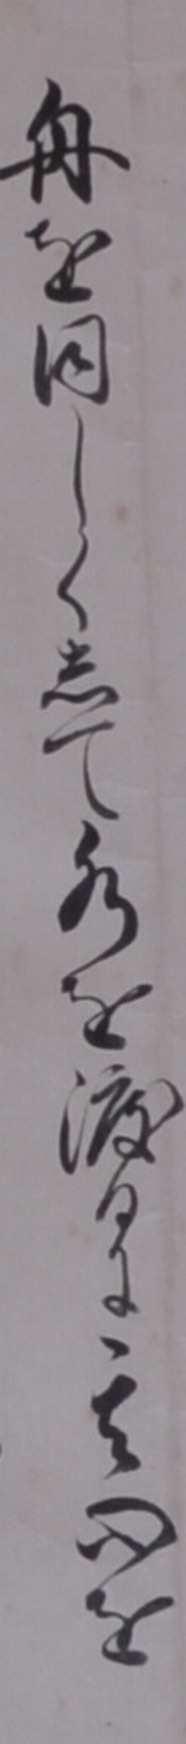舟を同しくして水を渡るに其心を
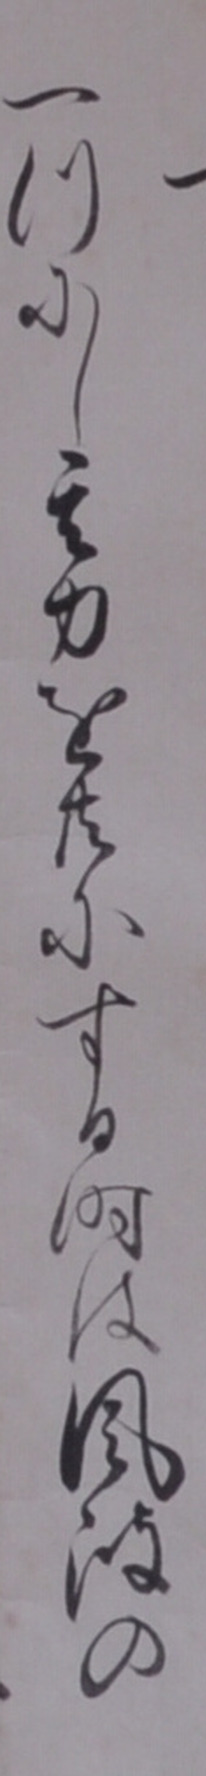一つにし其力を共にする時は風波の
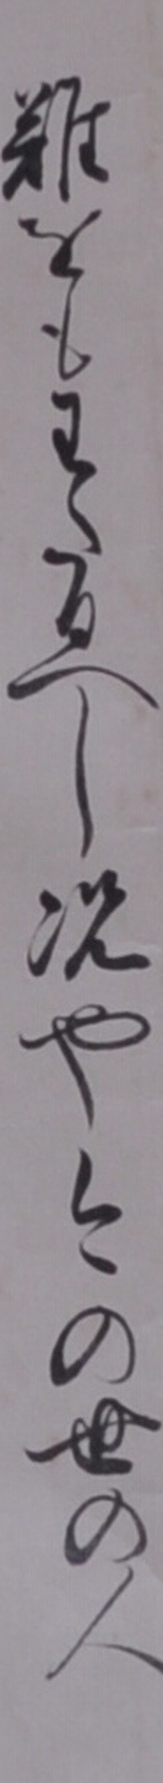難をもわたるへし況や今の世の人
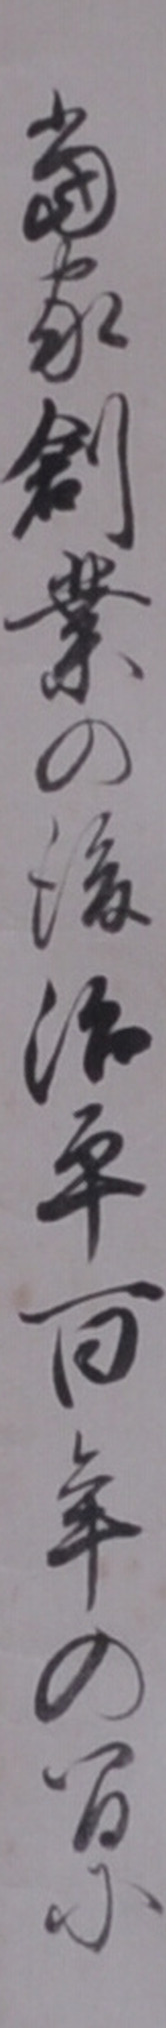当家創業の後治平百年の間に
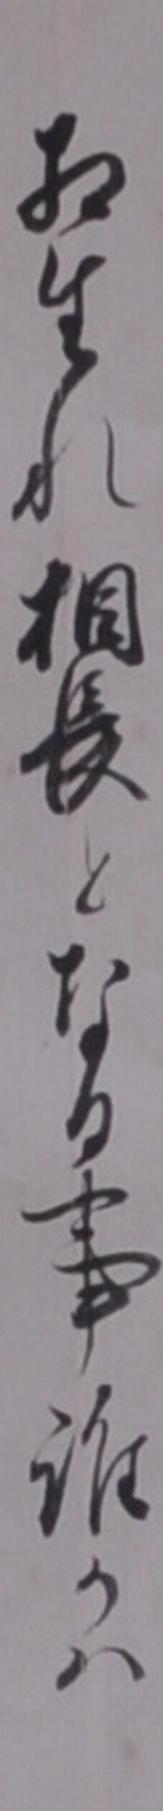相生れ相長となる事誰かは
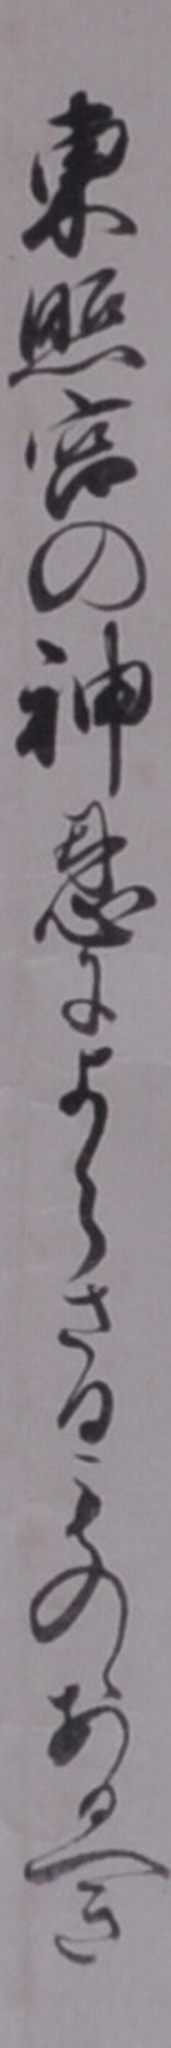東照宮の神恩によらさるものゝあるへき
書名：御書付之写
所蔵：伊那市立高遠町図書館・合同会社AMANE
